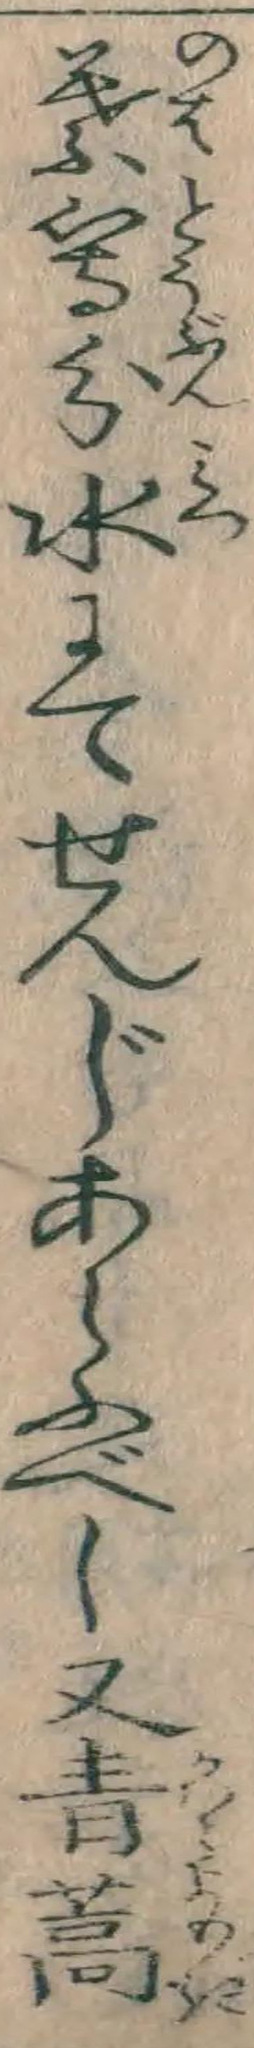葉等分水にてせんじあらふべし又青蒿

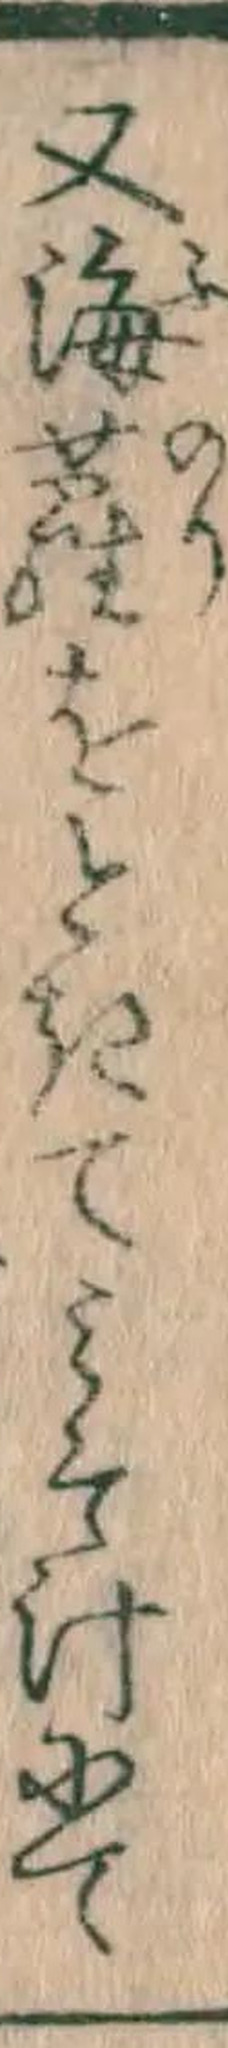又海蘿をときてみそ汁にて
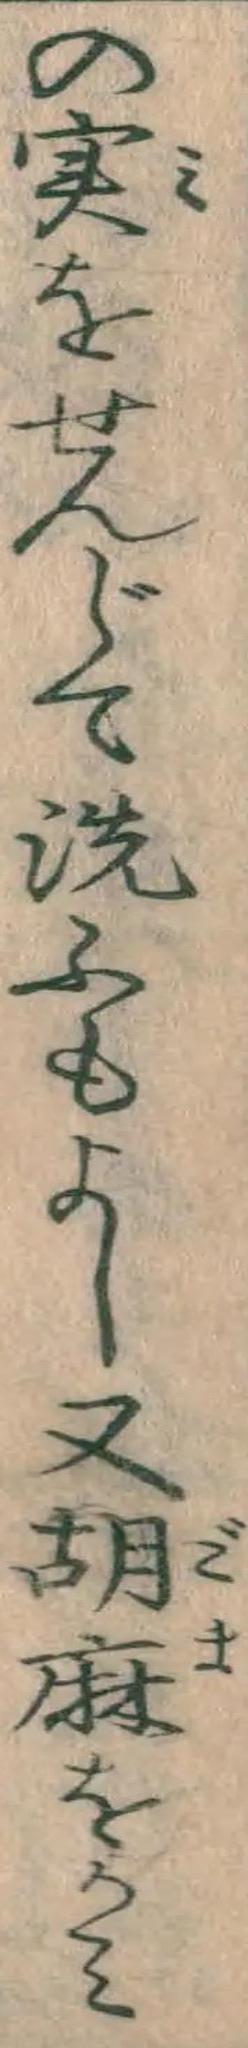の実をせんじて洗ふもよし又胡麻をかみ
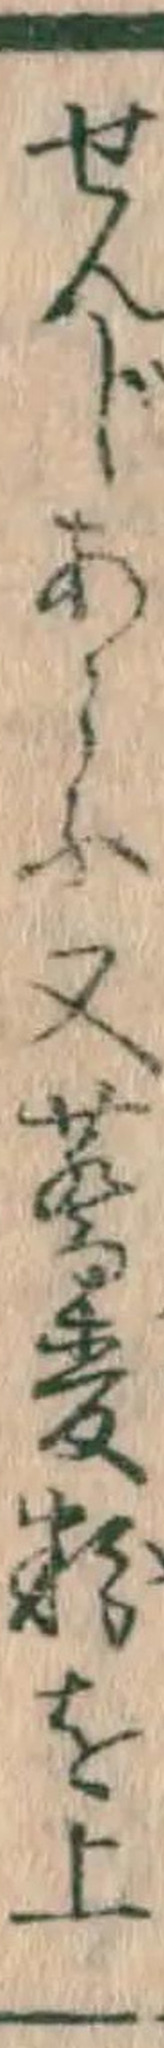せんじあらふ又蕎麦粉を上
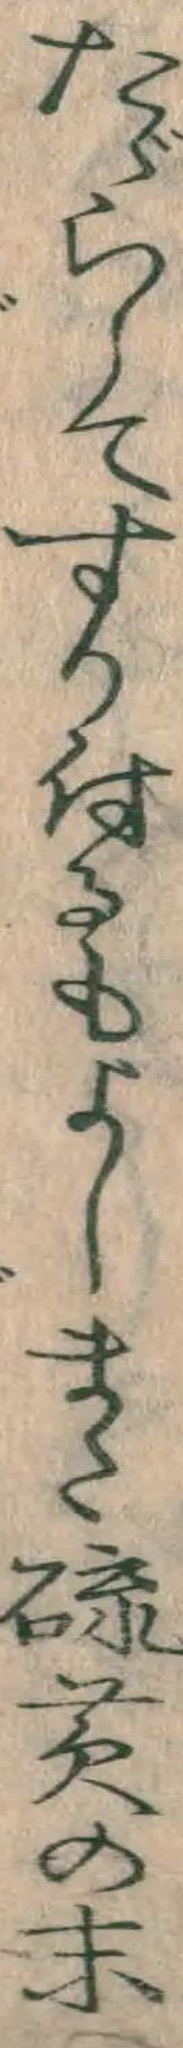たゞらしてすり付るもよしまた硫黄の末
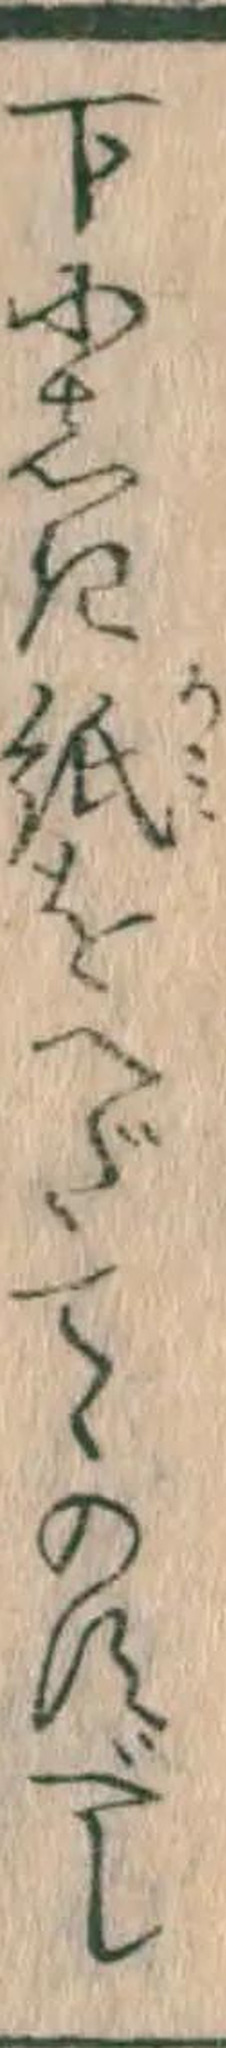下にしき紙をへだてゝのすべし
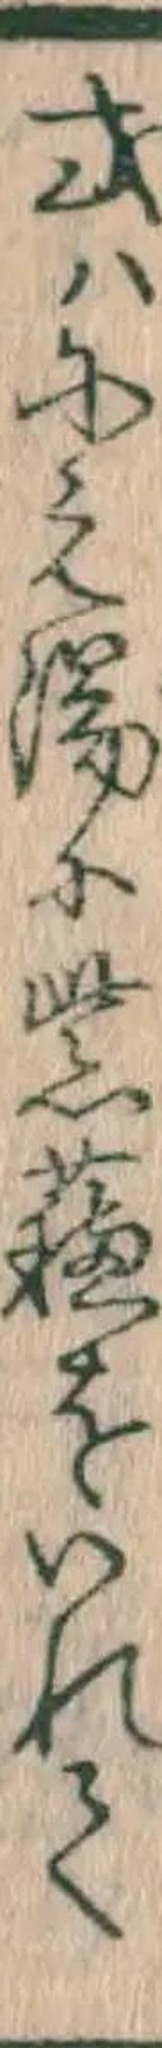或はにえ湯に紫蘇をいれて
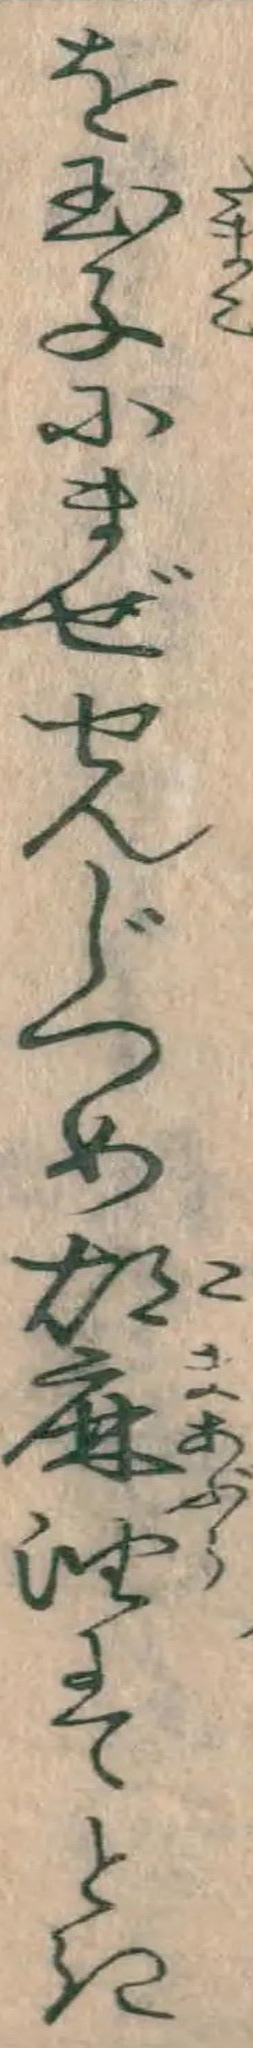を玉子にまぜせんじつめ胡麻油にてとき
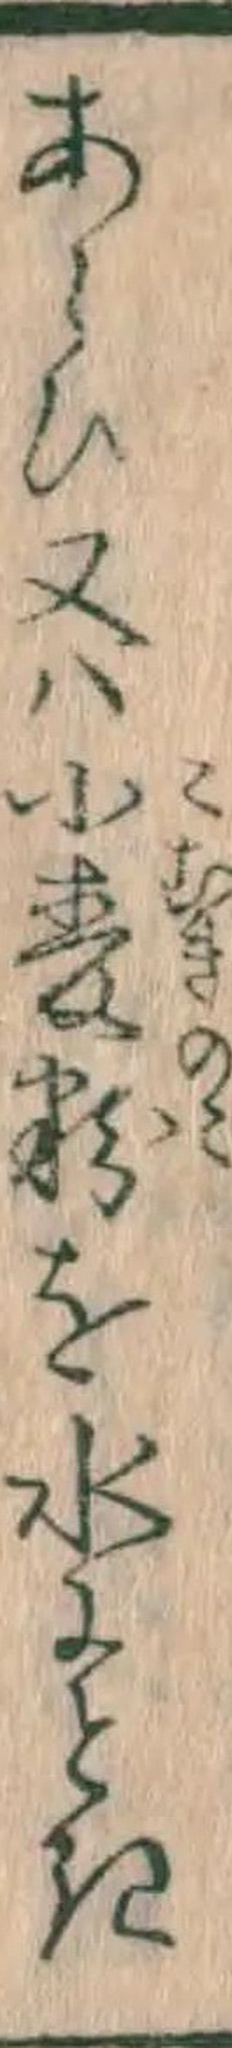あらひ又は小麦粉を水にとき
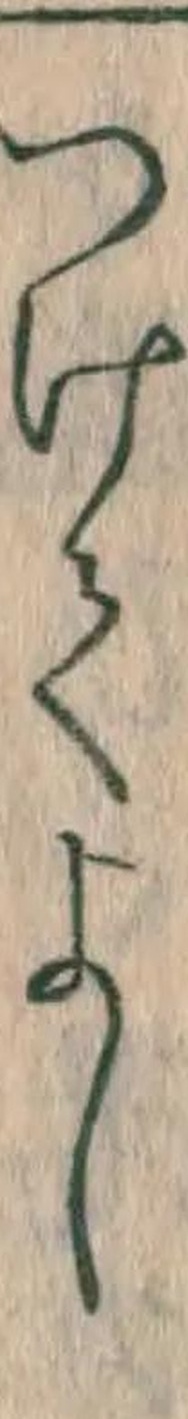つけてよし
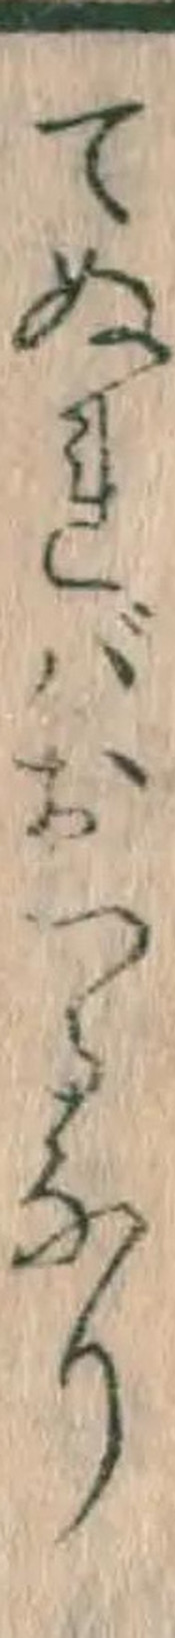てぬればおつるなり
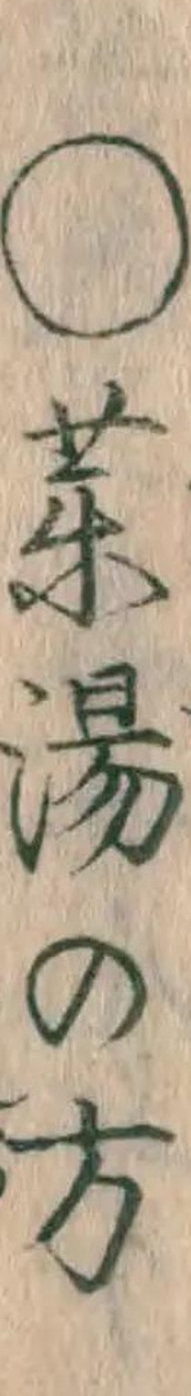○薬湯の方
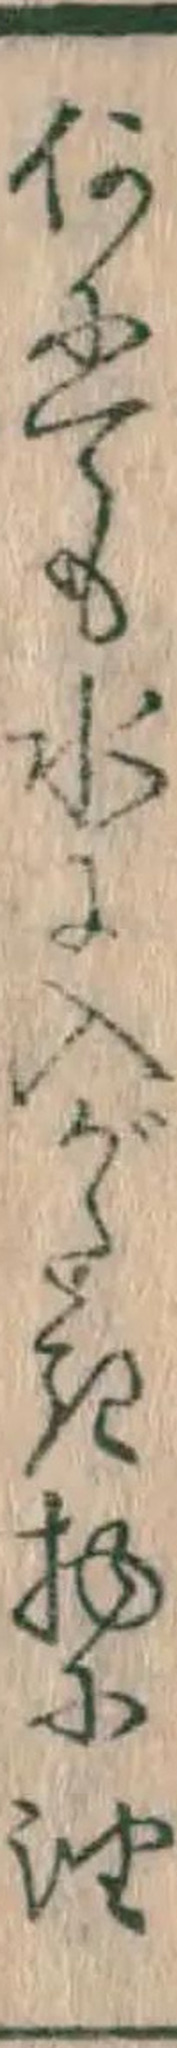何にても水に入がたき物に油
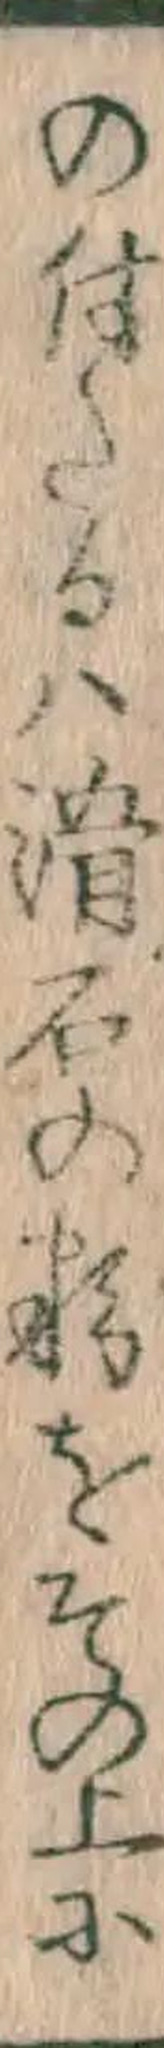の付たるは滑石の粉をその上に
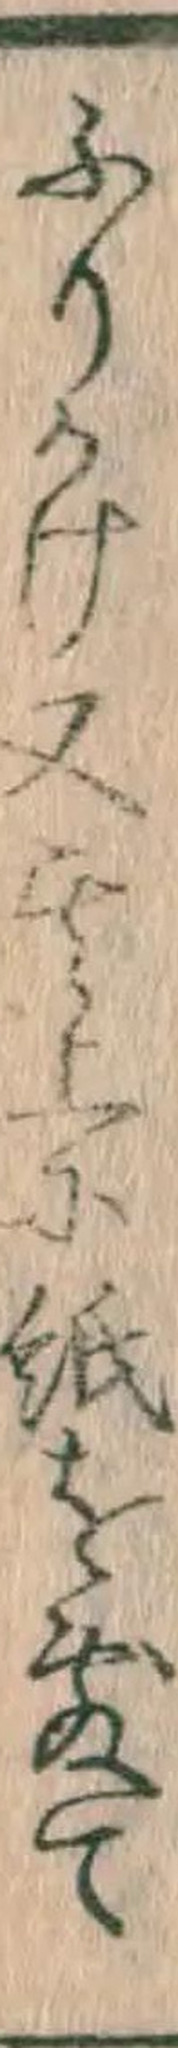ふりかけ又其上に紙を敷て
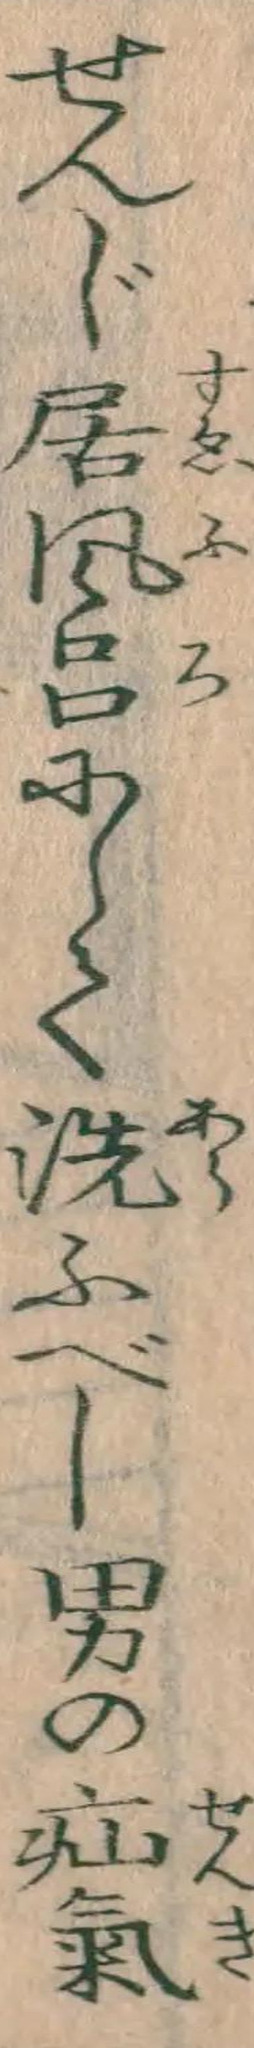せんじ居風呂にして洗ふべし男の疝気
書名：広益秘事大全 3巻. [3]
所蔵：国立国会図書館 National Diet Library, JAPAN
